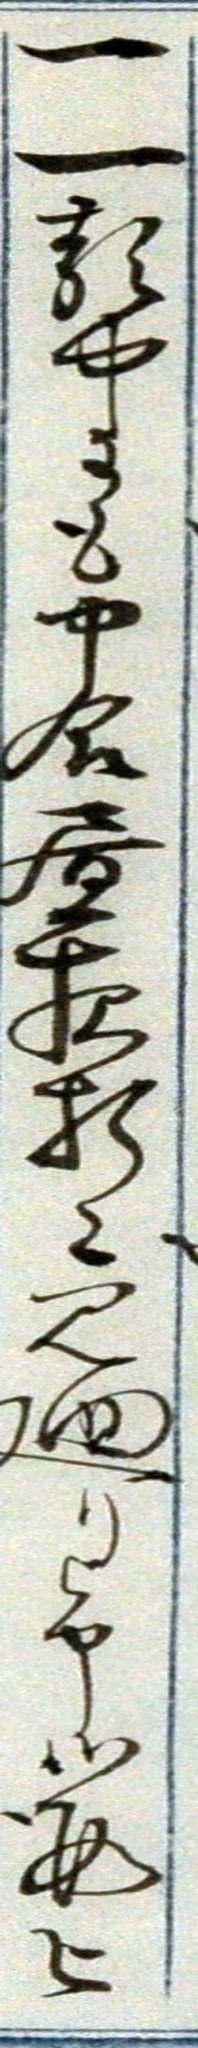一一類中尓も申合昼夜折々見廻り被申候段被
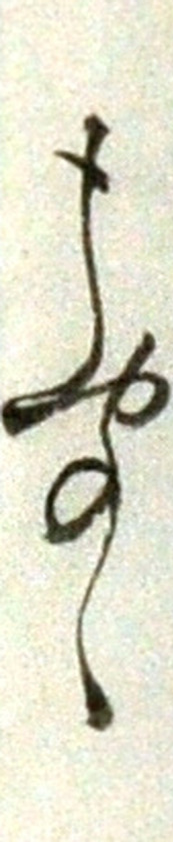申聞候

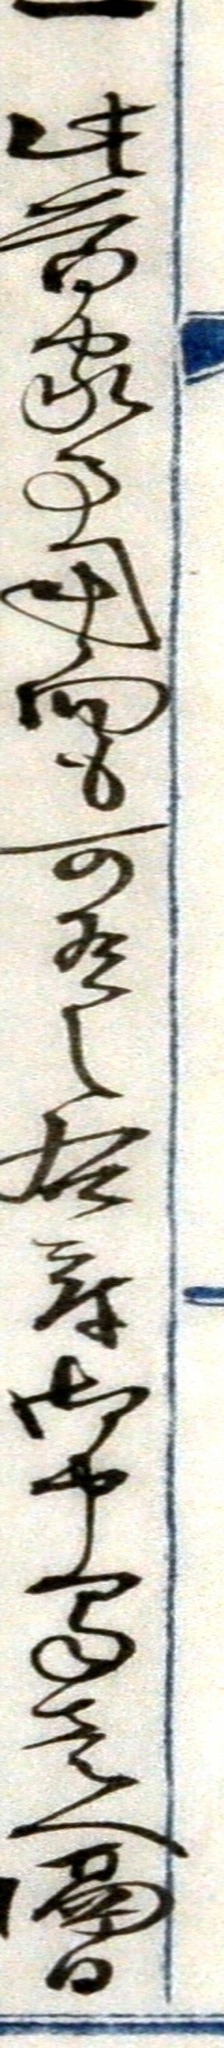一此二日家事用向も可有之右ニ付御中間壱人隔日
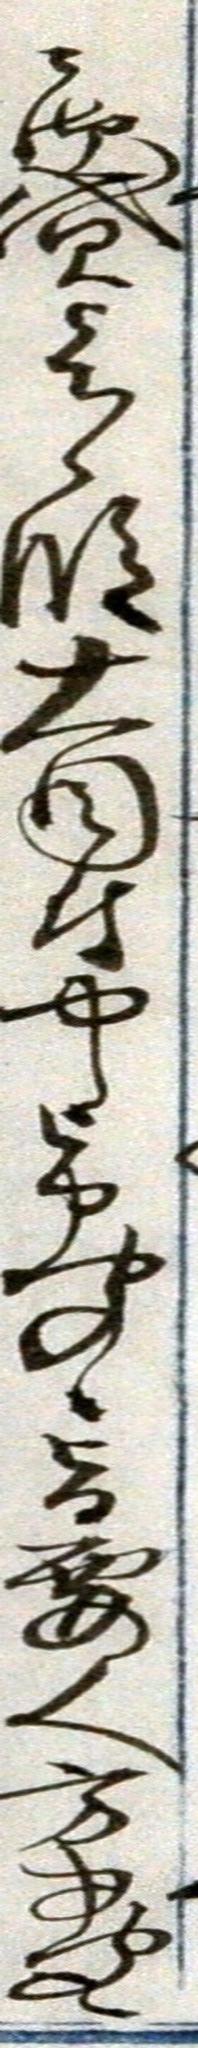ニ御貸被下候段大目付中被申聞候旨要人方申聞候
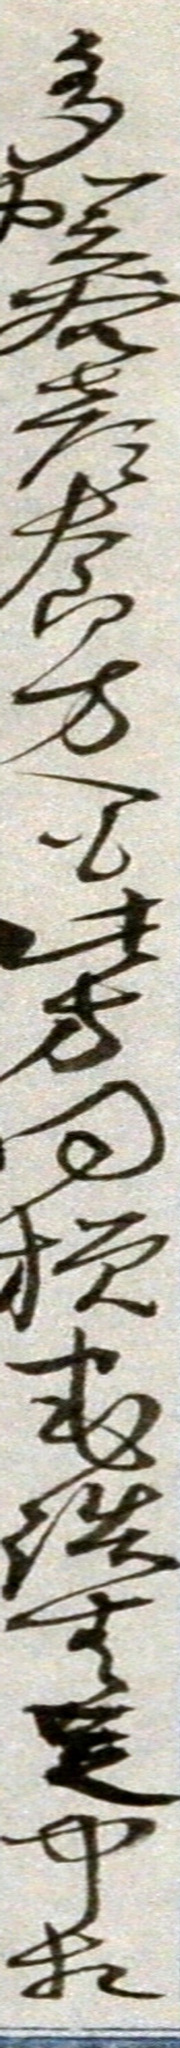一多賀谷彦太郎方へも此方同様宅詰無足中相
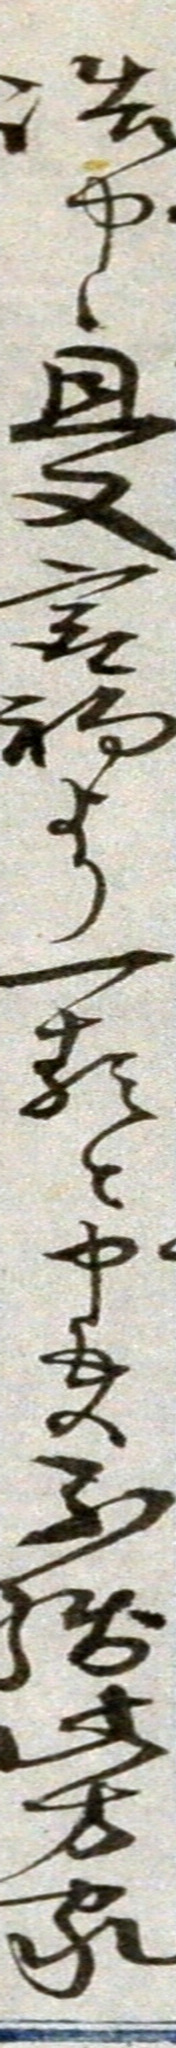詰申候且又最初より一類と申もの不残此方家
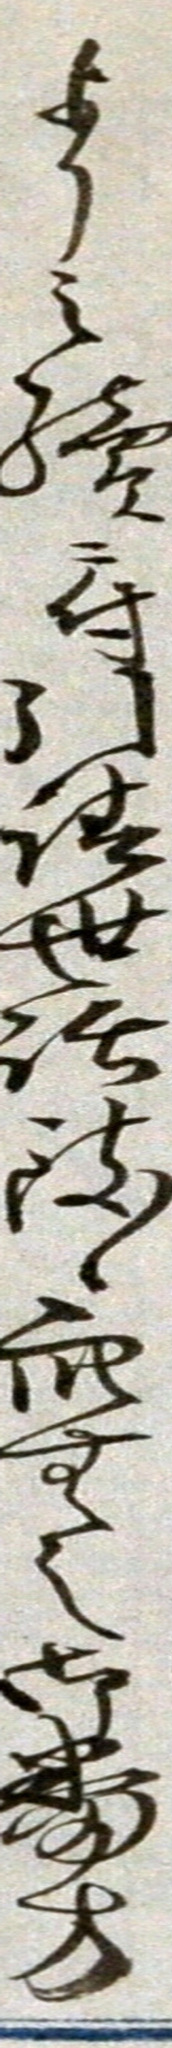より之續ニ付引請世話致候衆無之御番方
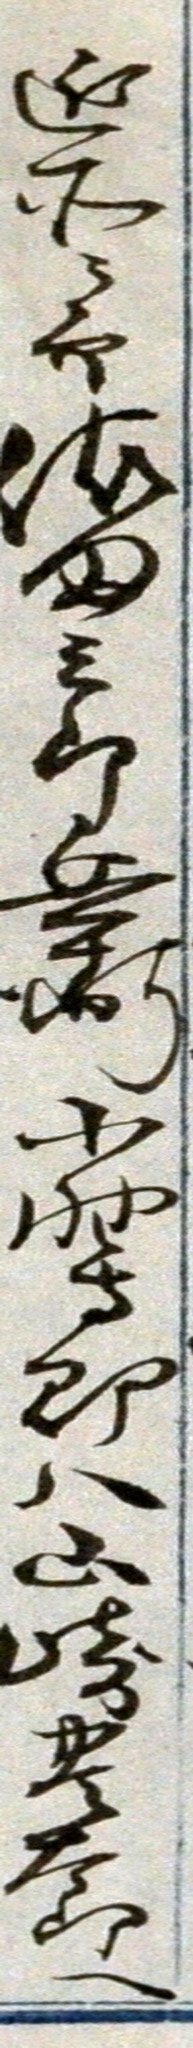近所ニ而依田三郎兵衛小野寺郡八山崎豊太郎へ
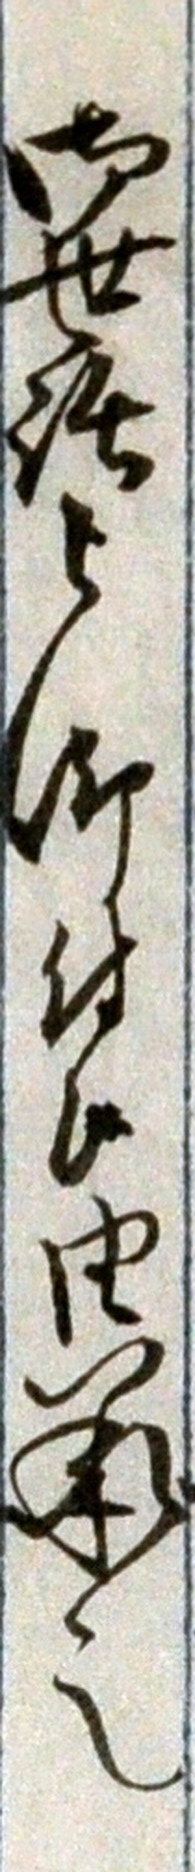御世話被仰付候由承之
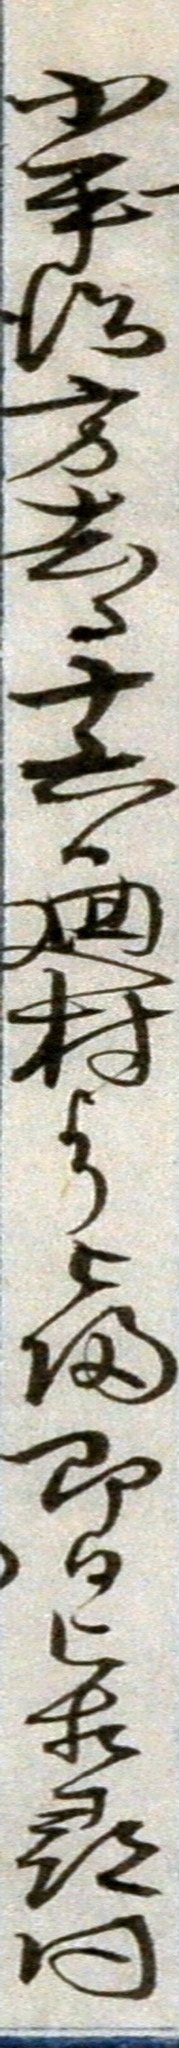一小平治方去る十六日廻村より被帰即日被相尋同
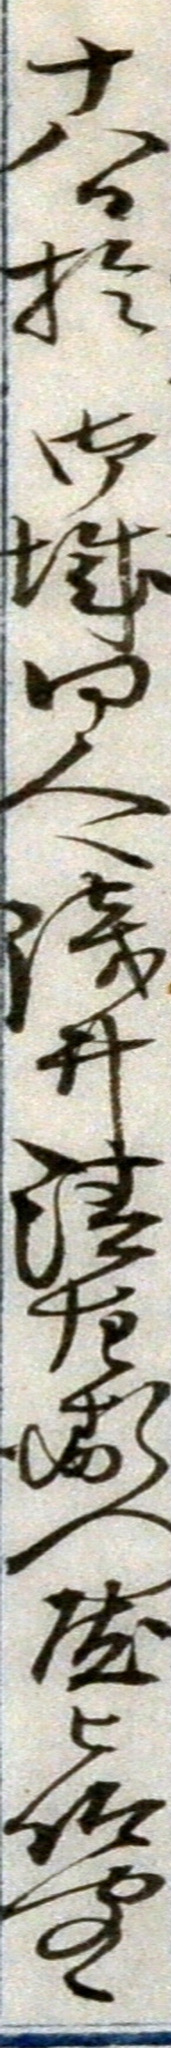十八日於御城同人へ浅井清左衛門殿被仰聞候
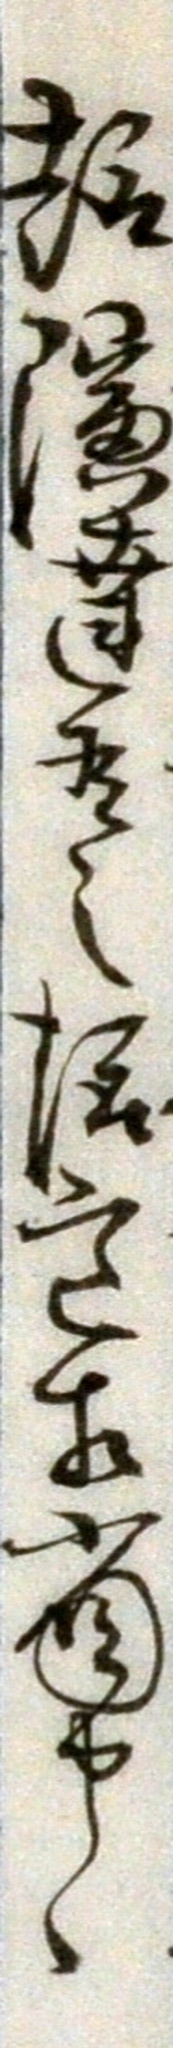趣演達有之趣意相省申候
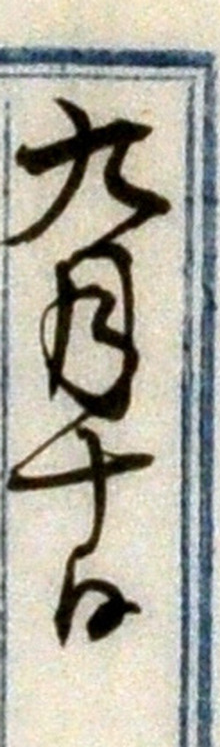九月十日
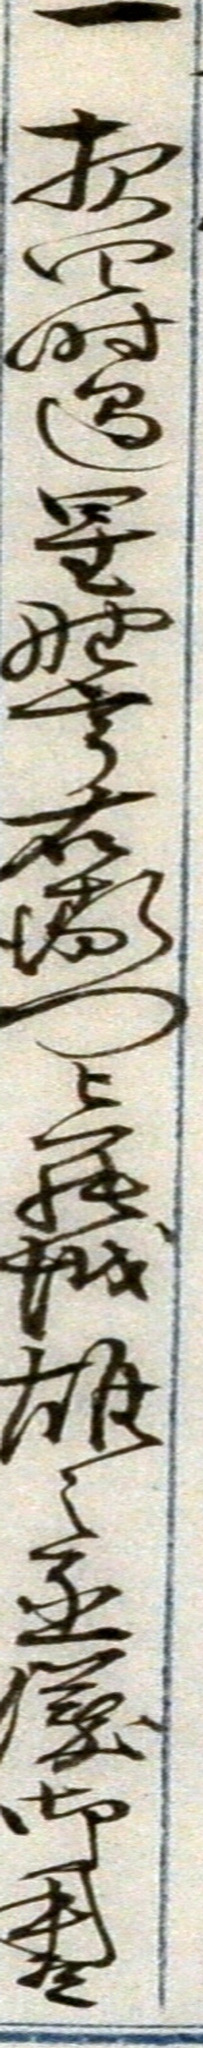一夜四時過星野宇右衛門被罷越雄之丞儀御用有
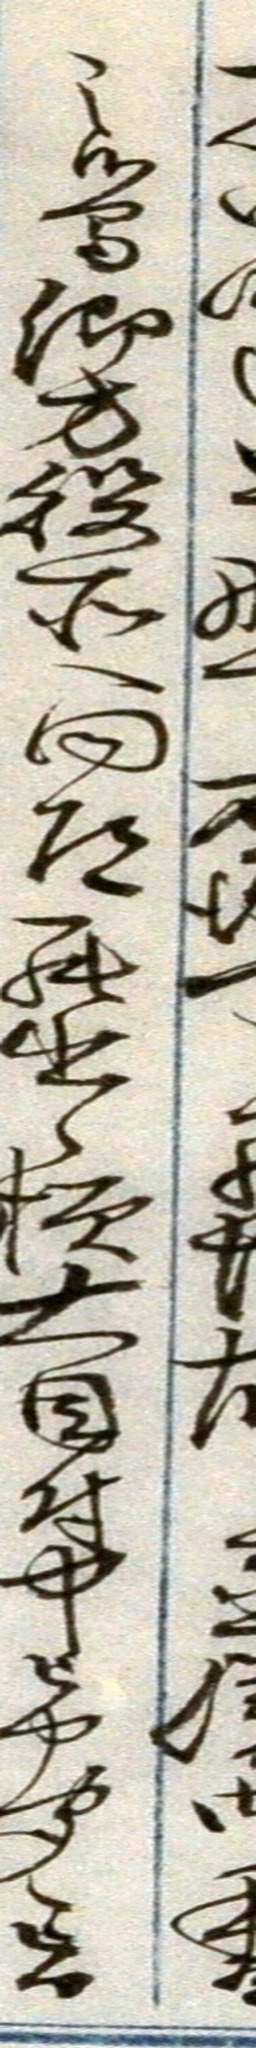之候間郷方役所へ同道罷出候様大目付中被申聞候旨
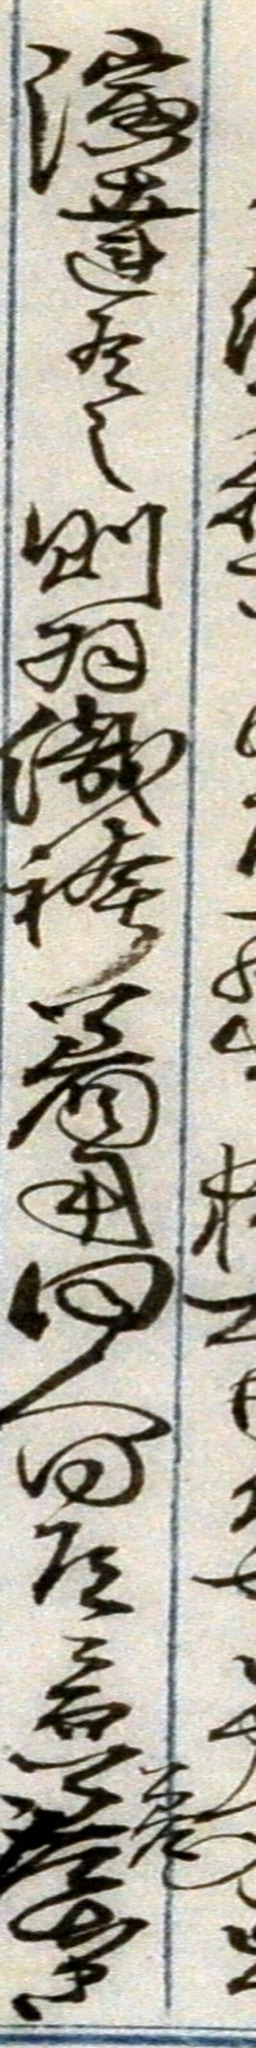演達有之則羽織袴着用同人同道ニ而差出申候
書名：川面小藤太子細有之多賀谷唯右衛門ヲ打果候一件
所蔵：伊那市立高遠町図書館・合同会社AMANE
